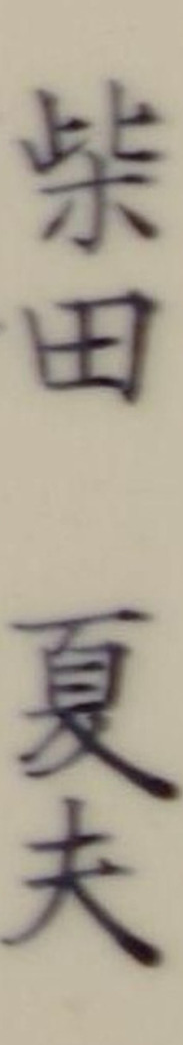柴田夏夫
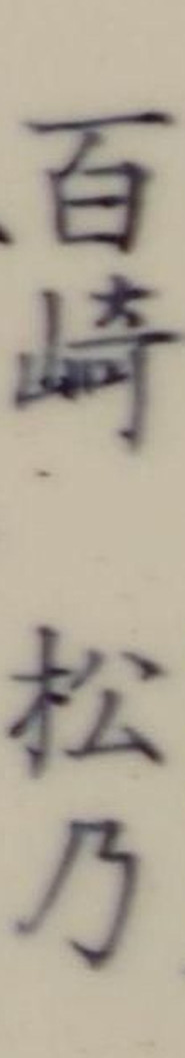百崎松乃
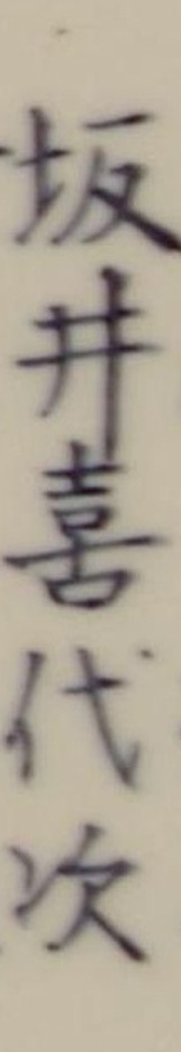坂井喜代次
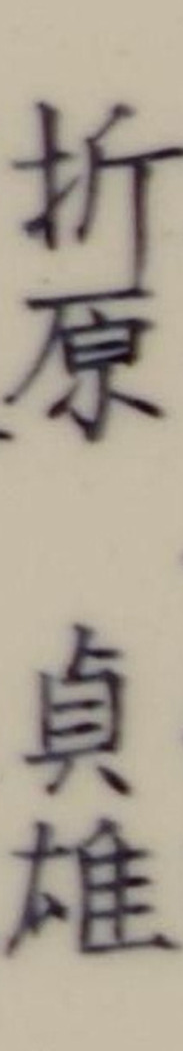柳原貞雄
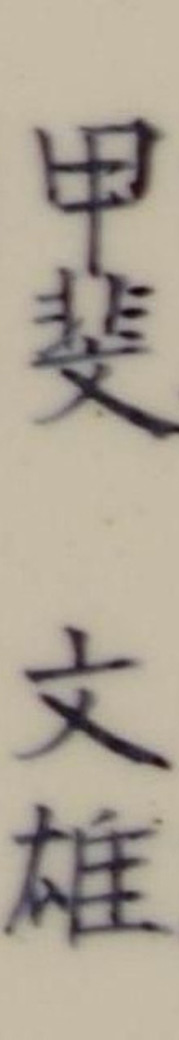甲斐文雄
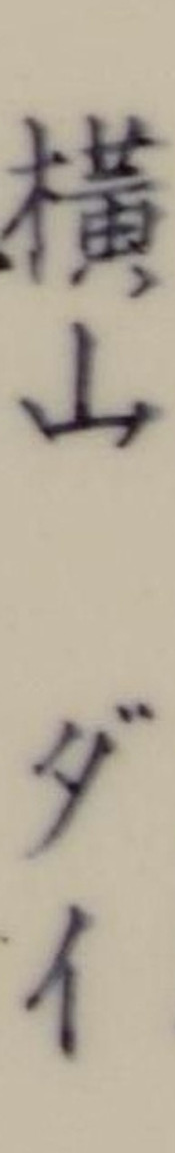横山ダイ
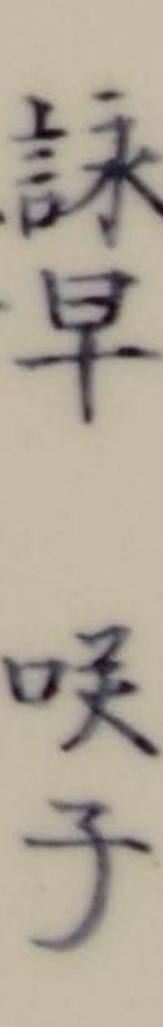詠早咲子
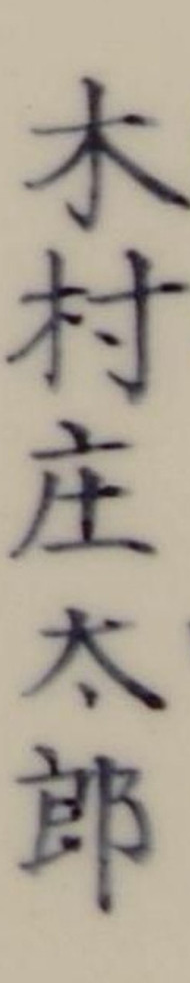木村庄太郎
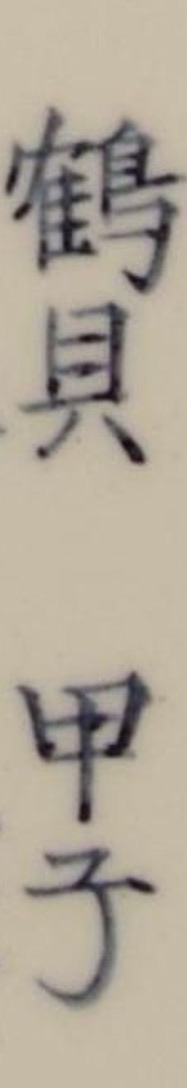鶴貝甲子
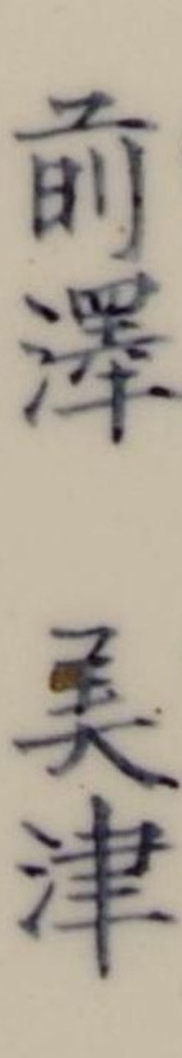前澤美津
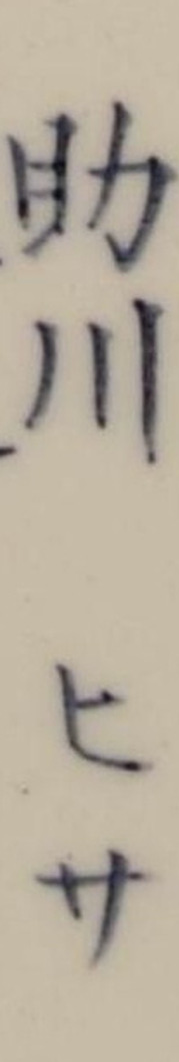助川ヒサ
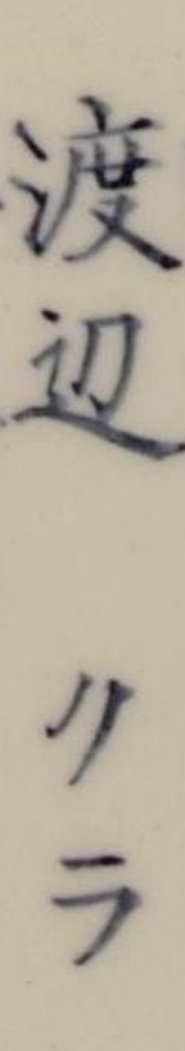渡辺クラ
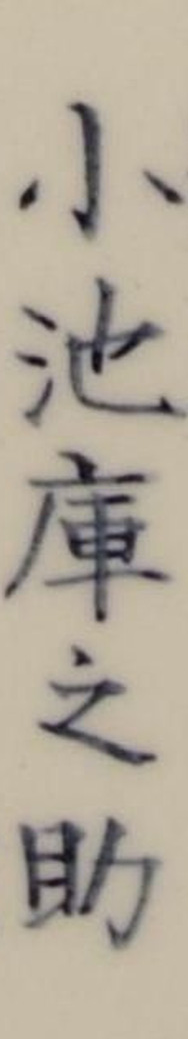小池庫之助
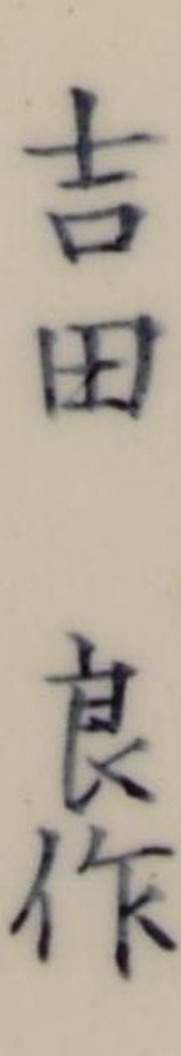吉田良作
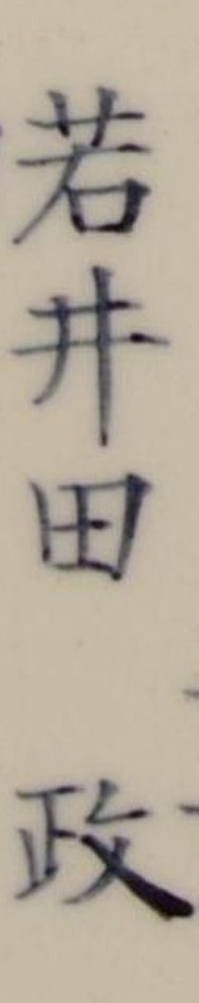若井田政
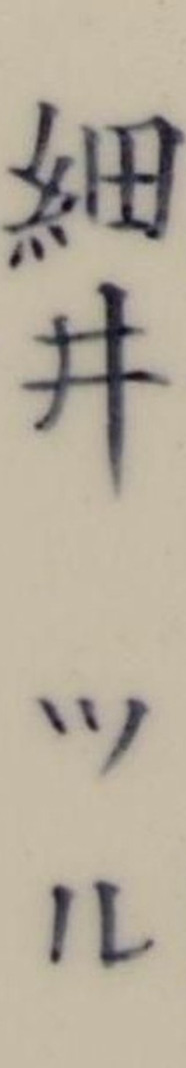細井ツル
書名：M~S
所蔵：高野山金剛峯寺
